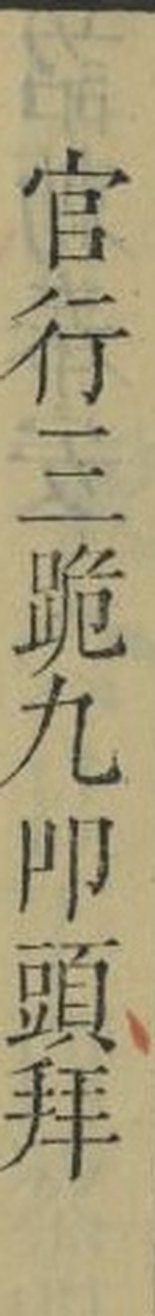官行三跪九叩頭拜
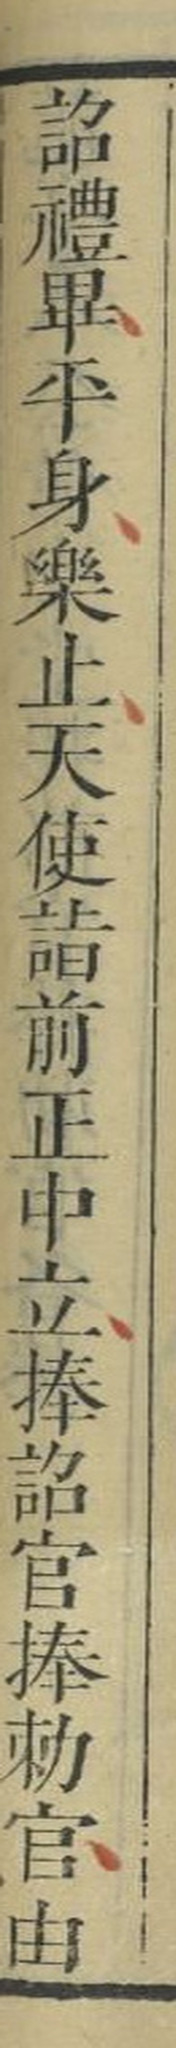詔禮畢平身樂止天使詣前正中立捧詔官捧勅官由
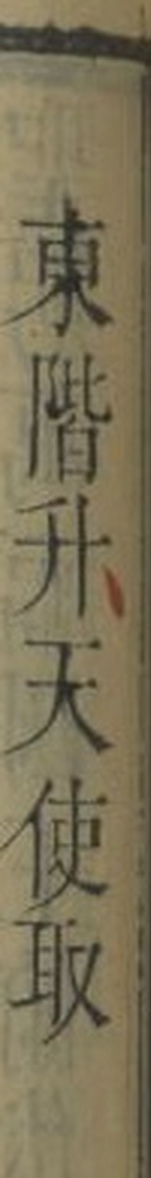東階升天使取
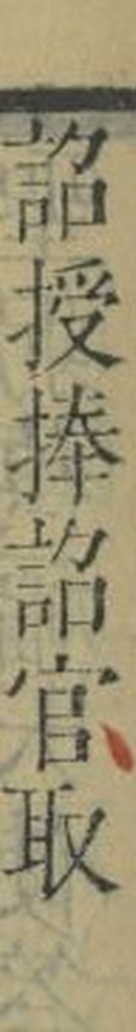詔授捧詔官取
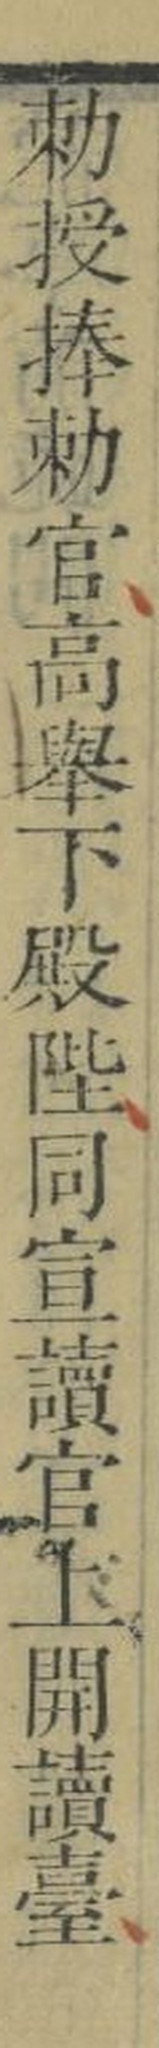勅授捧勅官高舉下殿陛同宣讀官上開讀臺
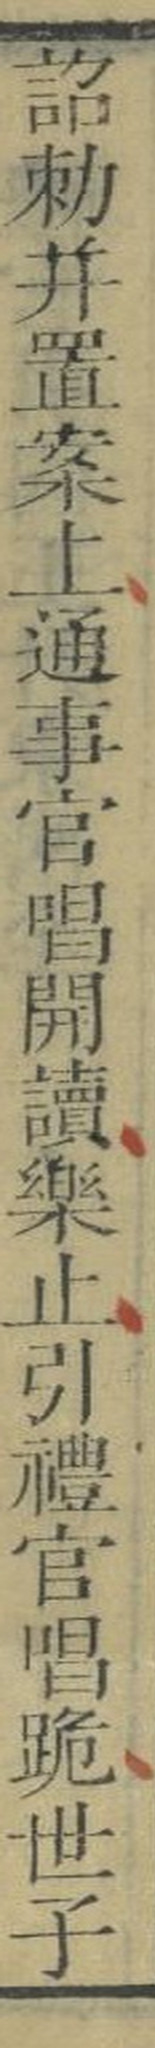詔勅并置案上通事官唱開讀樂止引禮官唱跪世子
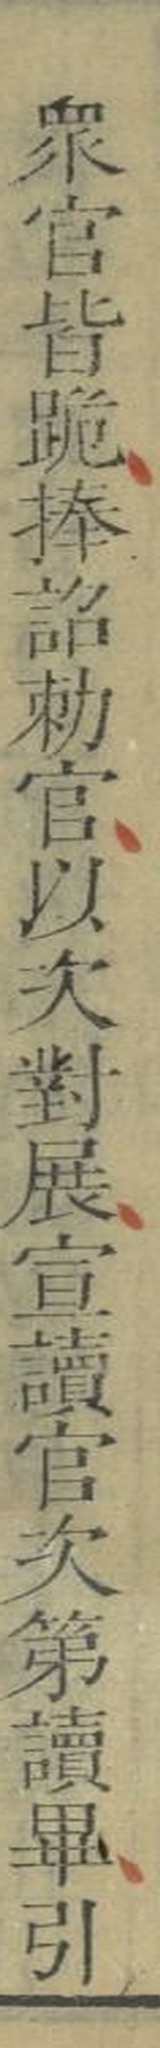衆官皆跪捧詔勅官以次對展宣讀官次第讀畢引
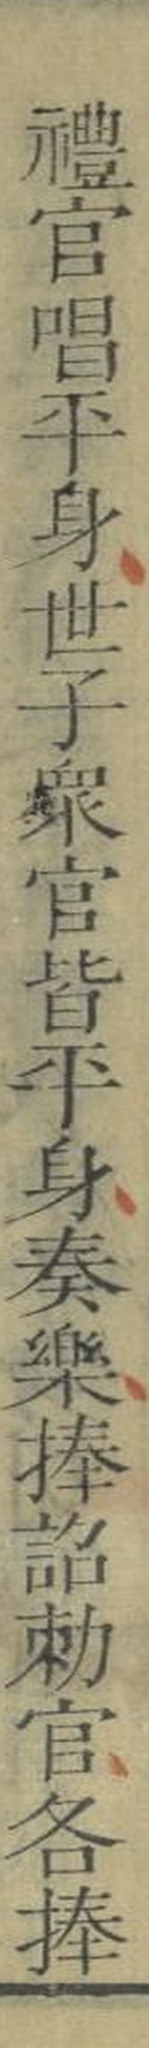禮官唱平身世子衆官皆平身奏樂捧詔勅官各捧
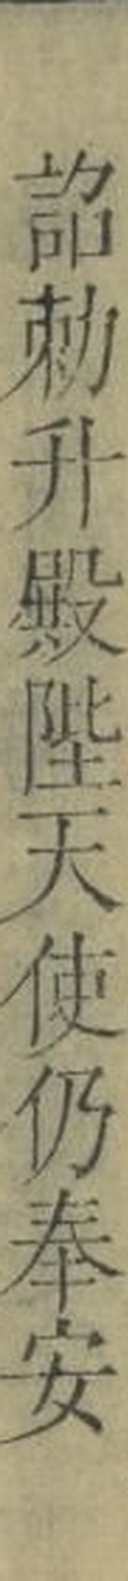詔勅升殿陛天使仍奉安
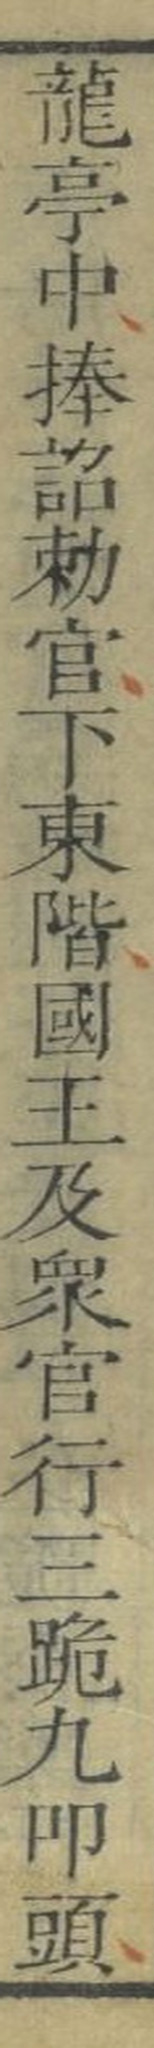龍亭中捧詔勅官下東階國王及衆官行三跪九叩頭
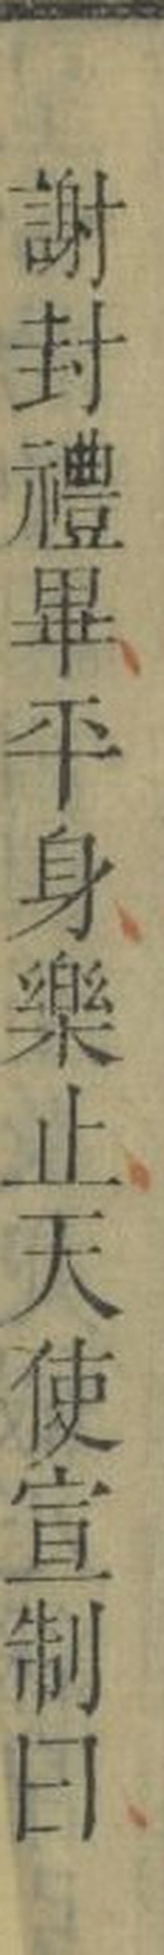謝封禮畢平身樂止天使宣制曰

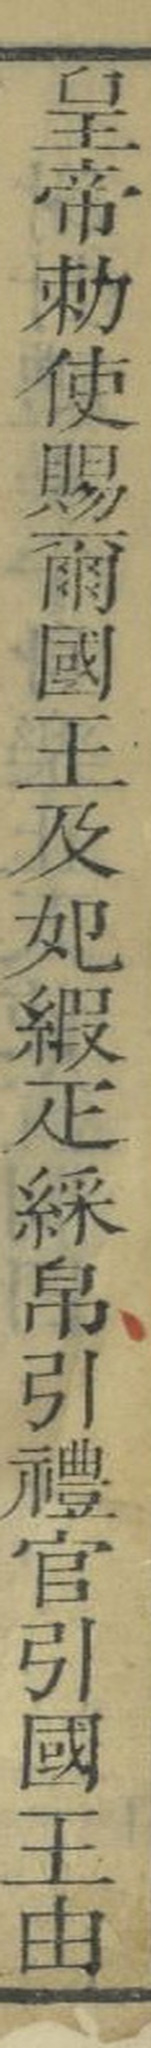皇帝勅使賜爾國王及妃縀疋綵帛引禮官引國王由
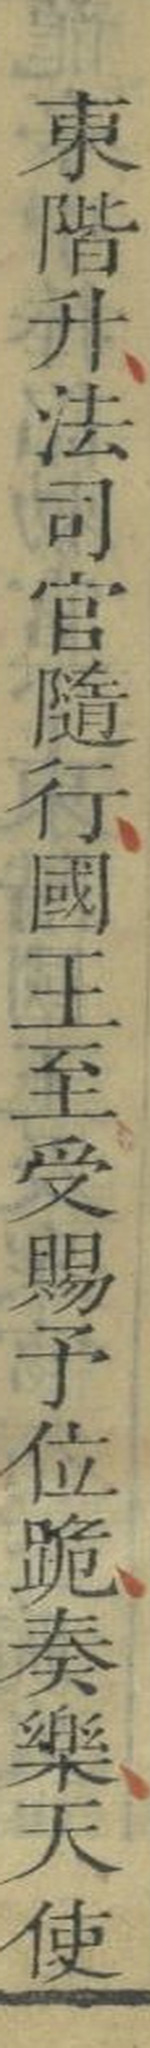東階升法司官隨行國王至受賜予位跪奏樂天使
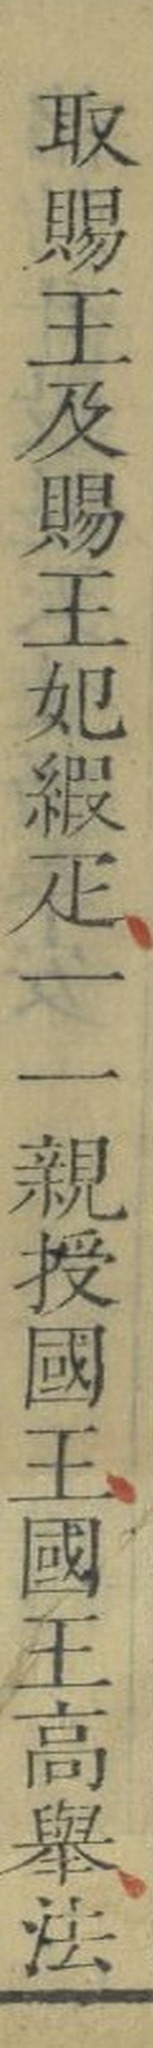取賜王及賜王妃縀疋一一親授國王國王高舉法
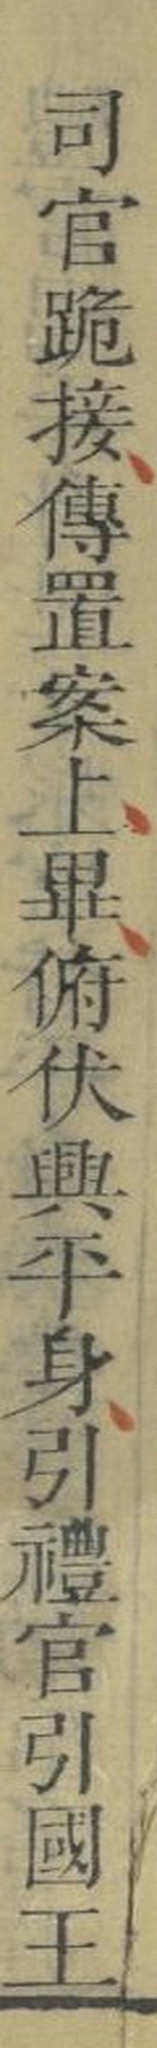司官跪接傳置案上畢俯伏興平身引禮官引國王
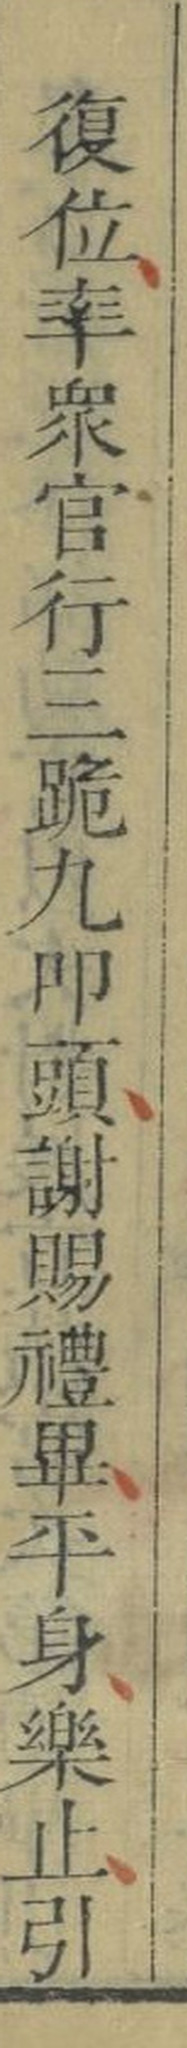復位率衆官行三跪九叩頭謝賜禮畢平身樂止引
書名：中山伝信録 巻一、巻二
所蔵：University of the Ryukyus Library
